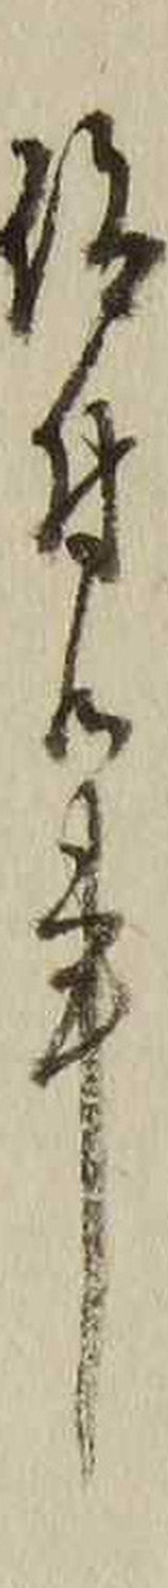仰付候事
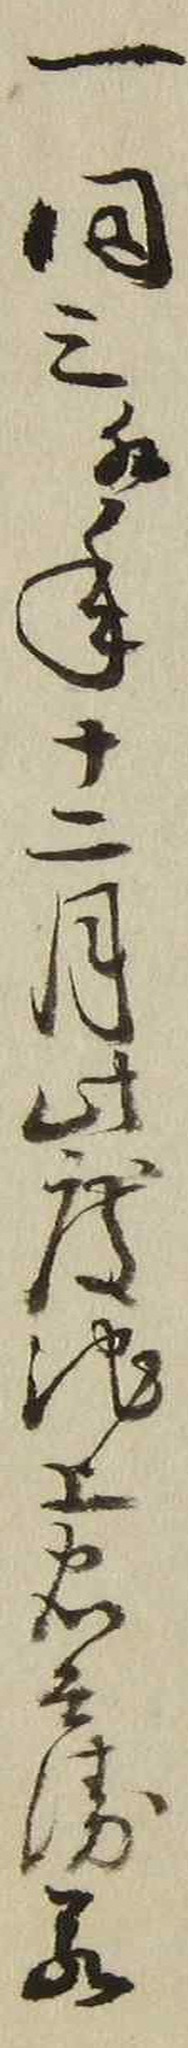一同三卯年十二月此度池上忠兵衛若
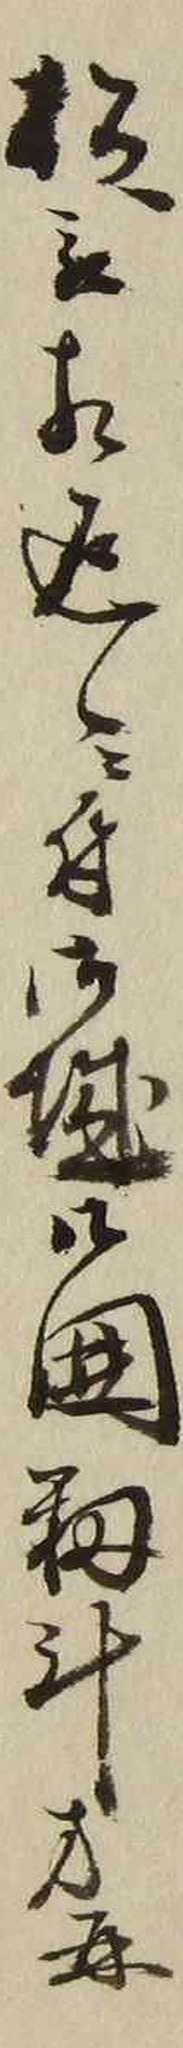松へ被相返候付ニ御城御囲籾計方并
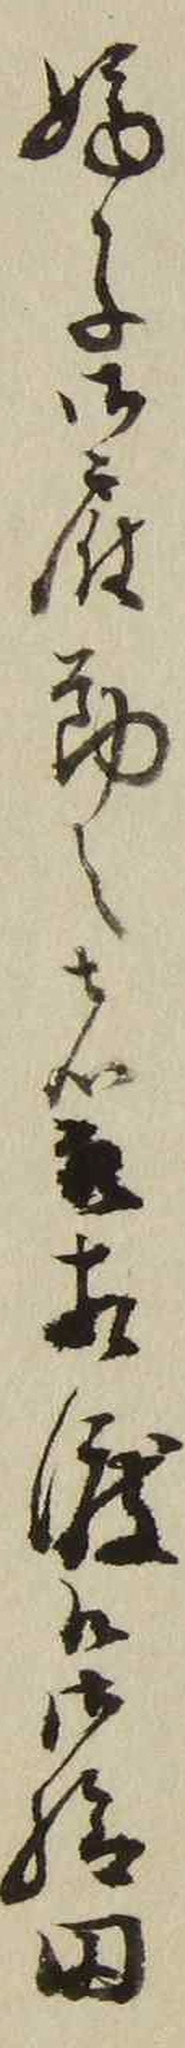嫡子御雇勤之者被相渡候御給田
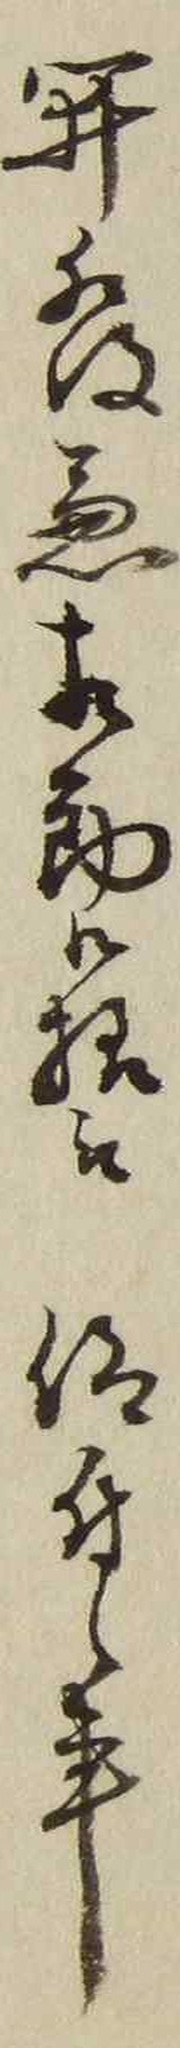開発兼相勤候様被仰付候事

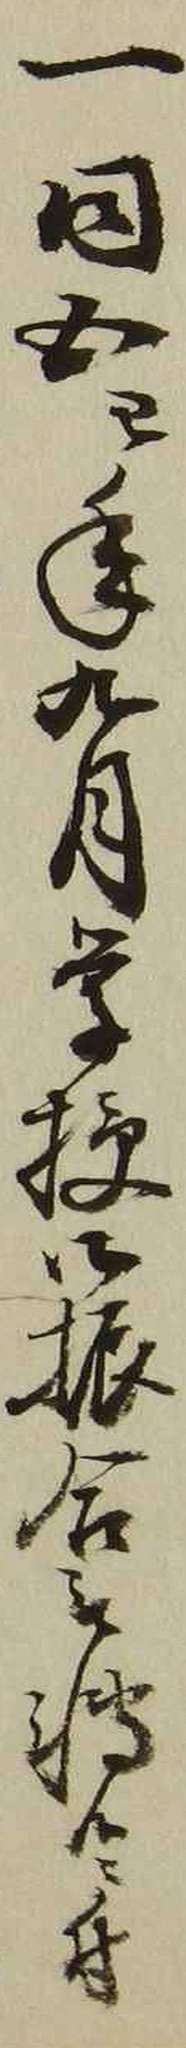一同五巳年九月学校御振合被転候ニ付
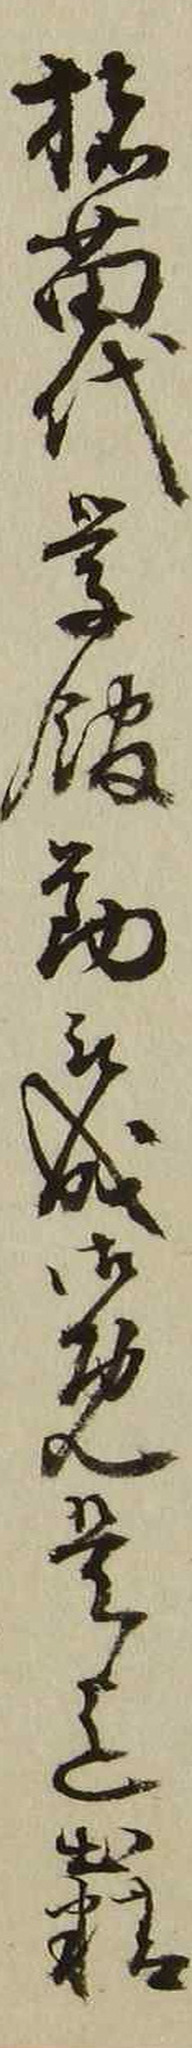猪苗代学館勤被成御免是迄出精
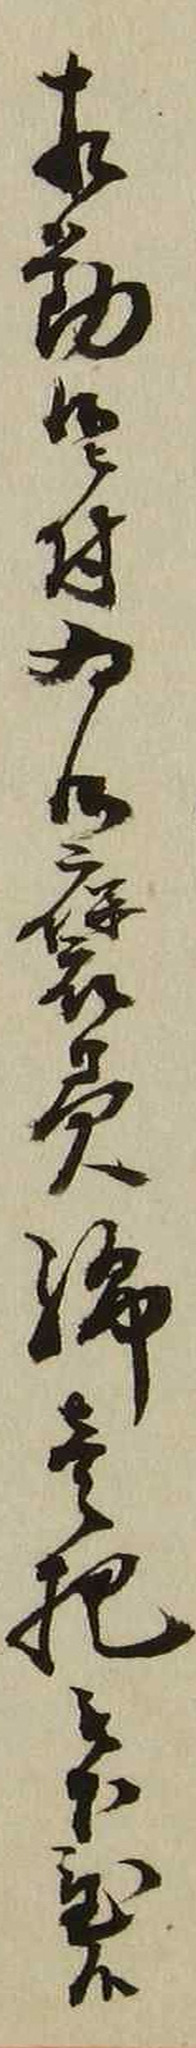相勤候ニ付為御褒美綿壱把被下置候
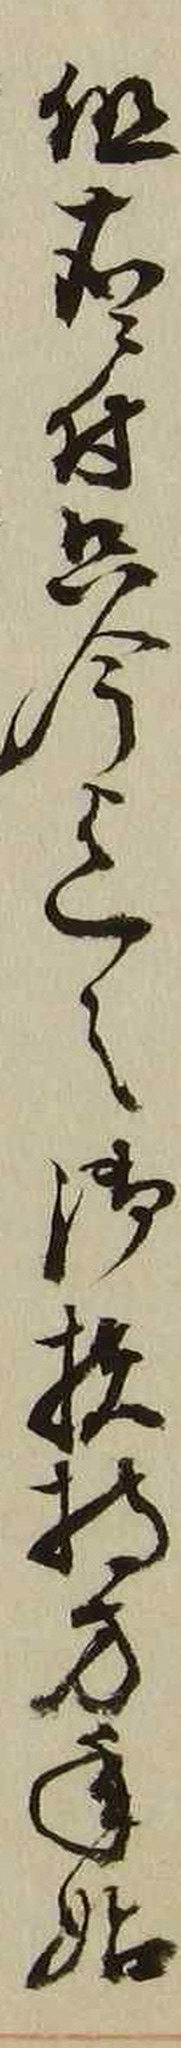但右ニ付只今迄之御扶持方年始
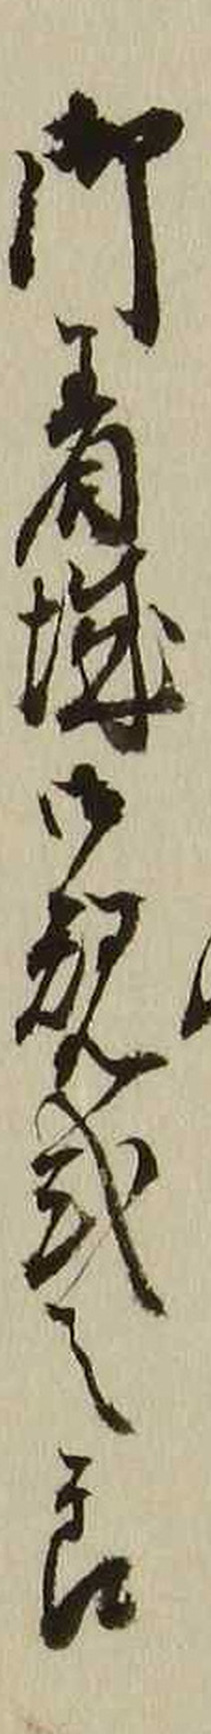御着城御規式之節
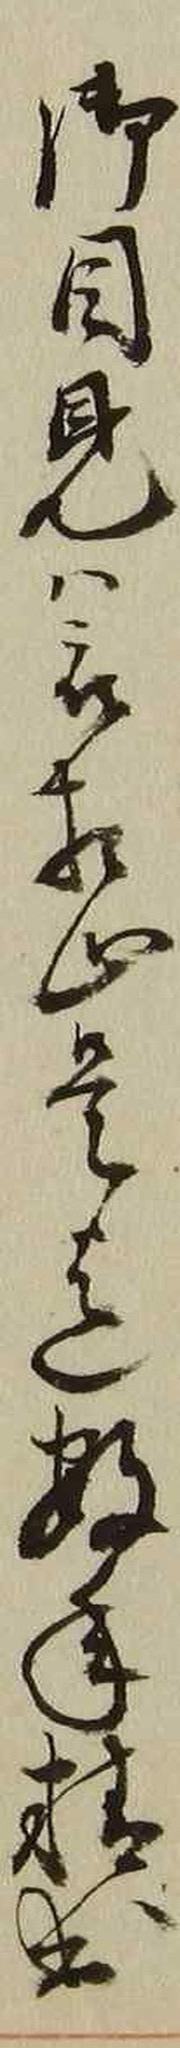御目見ハ被相止是迄数年精出
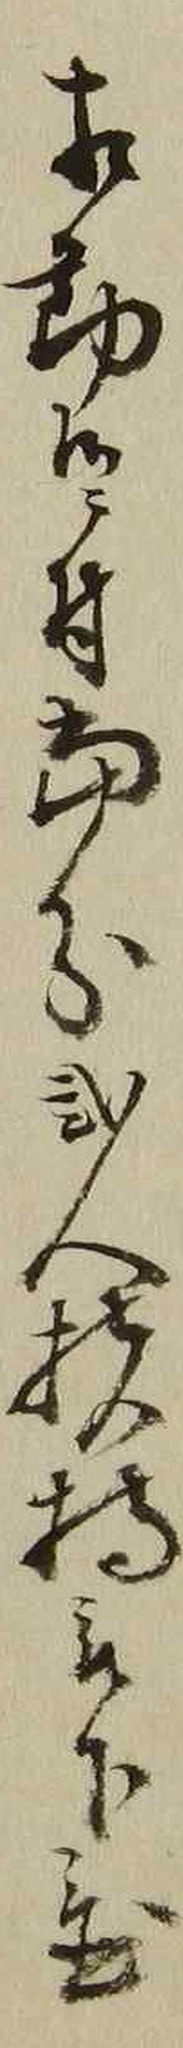相勤候ニ付当分弐人扶持被下置
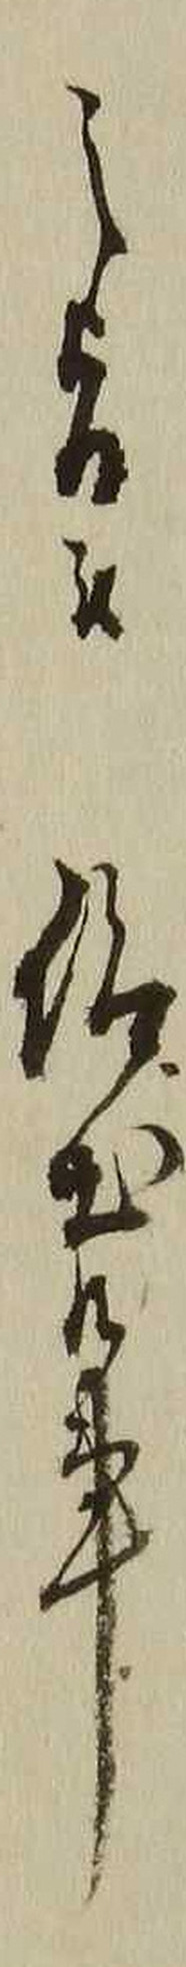之旨被仰出候事
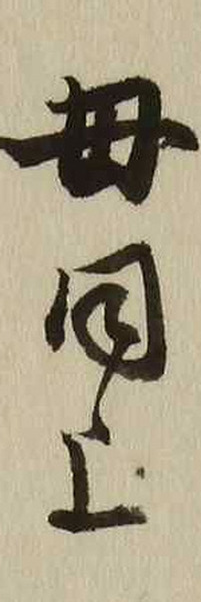母同上
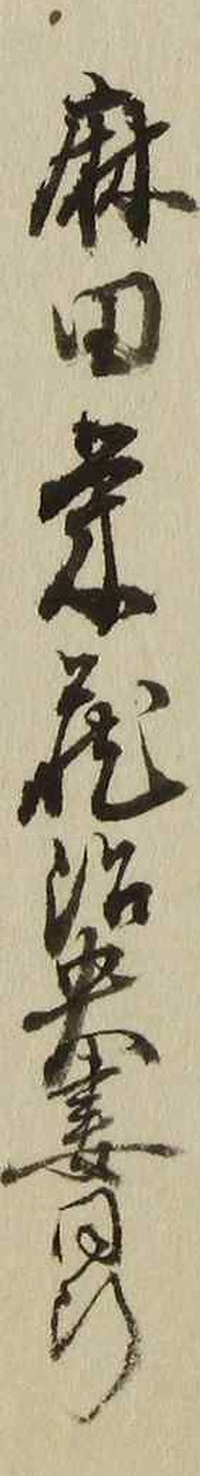麻田栄蔵治央妻同断
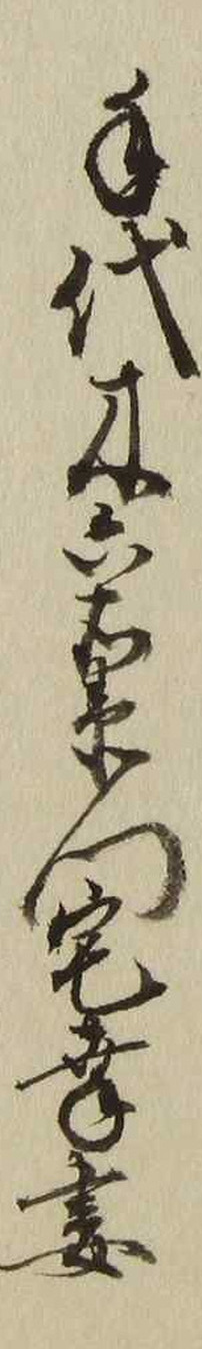手代木六右衛門宅幸妻
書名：諸士系譜　巻之36　は之部4
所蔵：会津若松市立会津図書館
